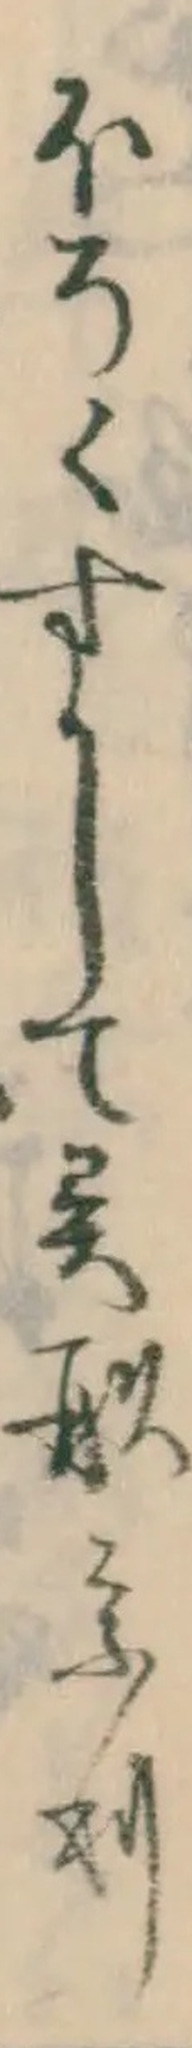ほそくすかして異形なり
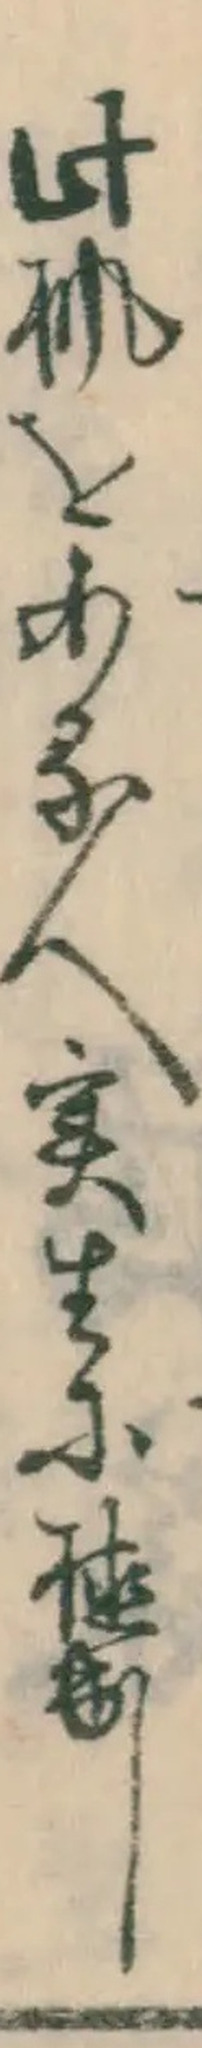此楓をある人実生に植出し
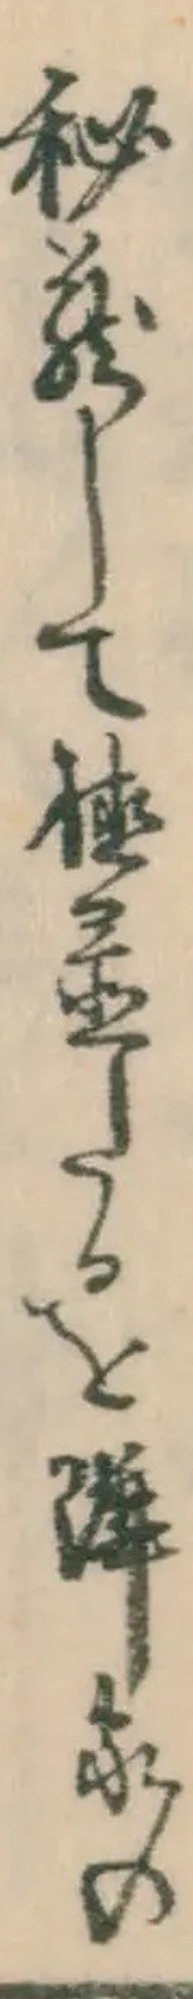秘蔵して植置たるを隣家の
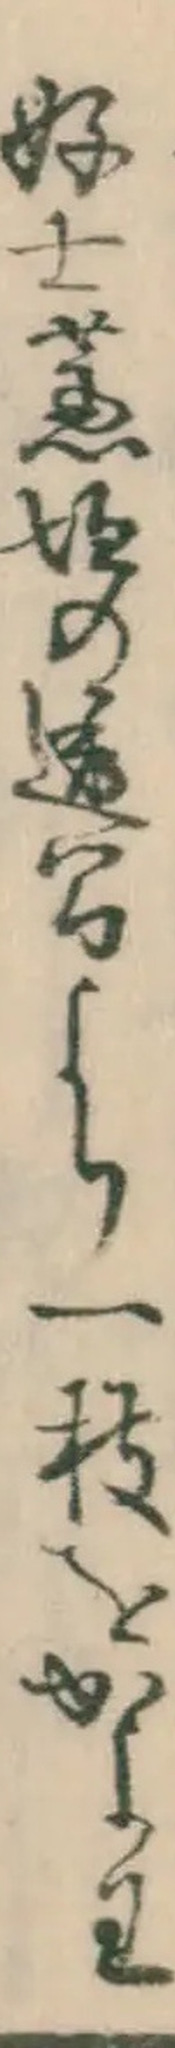好士蘆垣の透間より一枝をかよわ
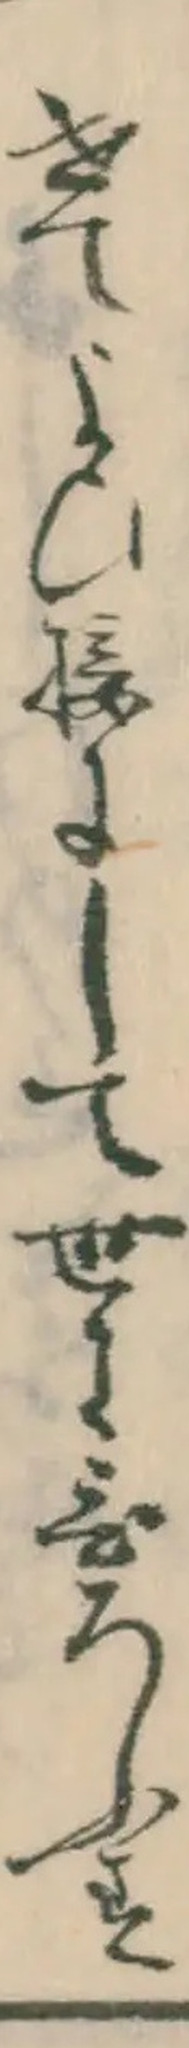せてよひ接にして世にひろふす
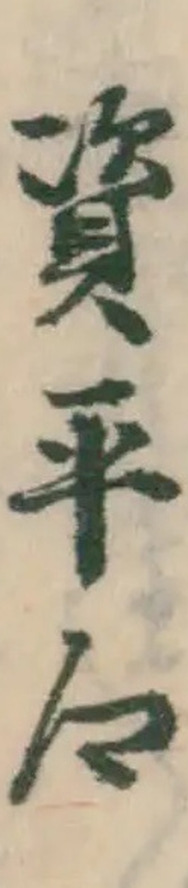資平卿
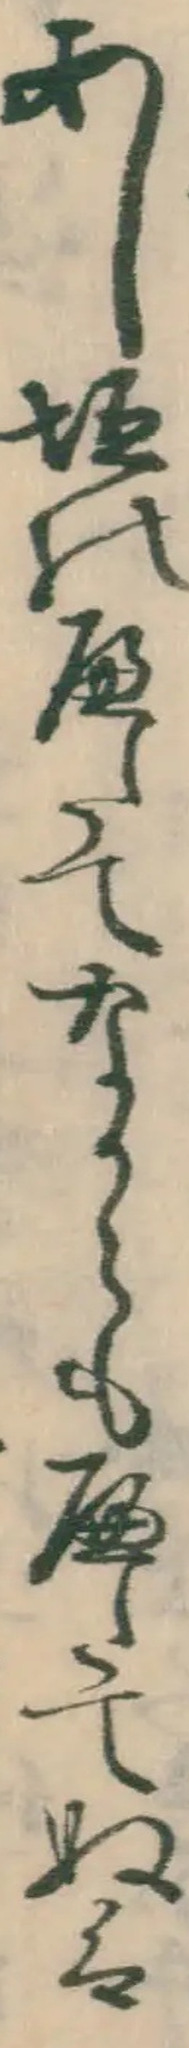あし垣のへたてなからもへたてぬは
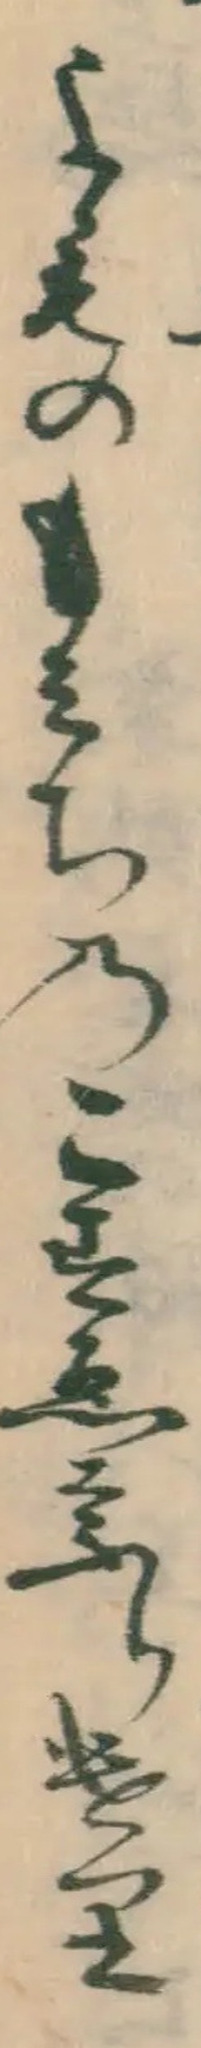よものもみちのこすゑなりけり

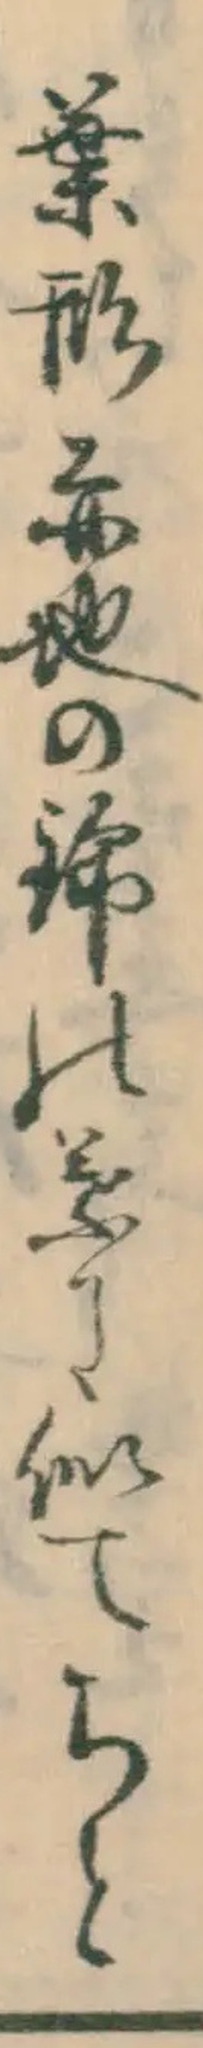鋪嶋葉形赤地の錦の葉に似てちと
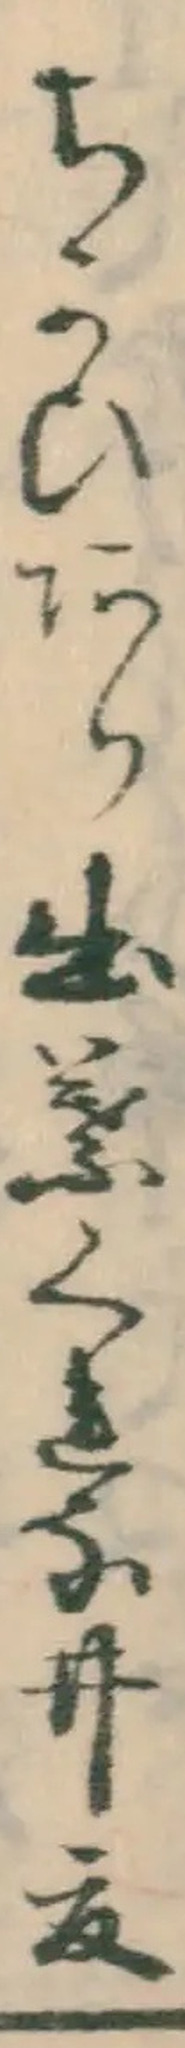ちかひあり出葉くれなゐ夏
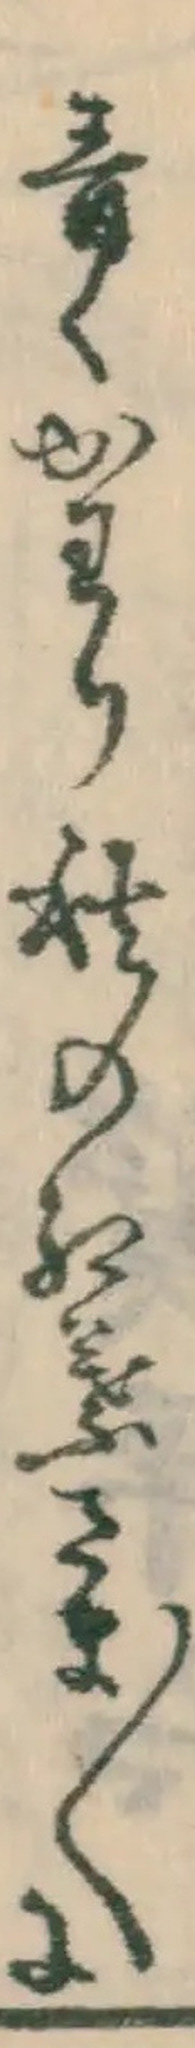青くかわり秋の紅葉さま〳〵に
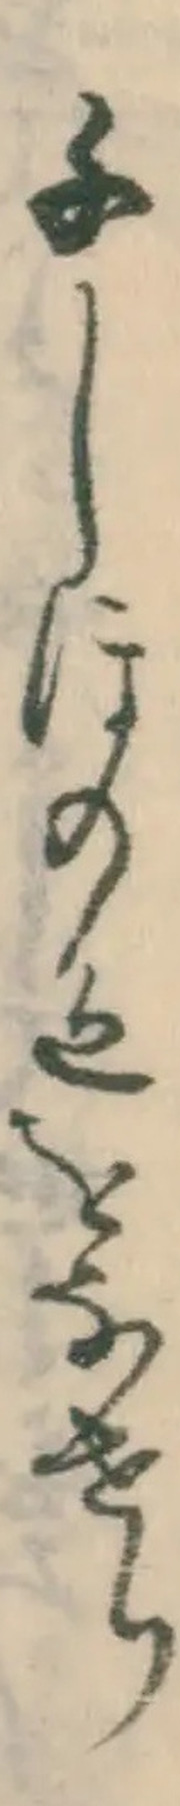千しほの色をなせり
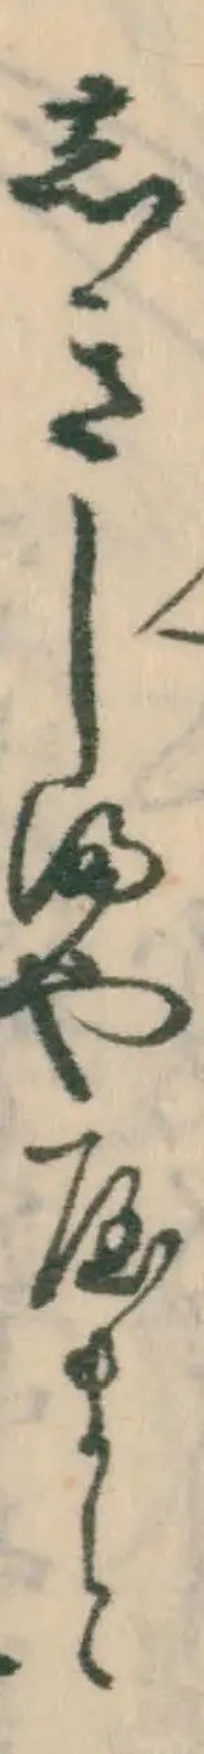しきしまややまと
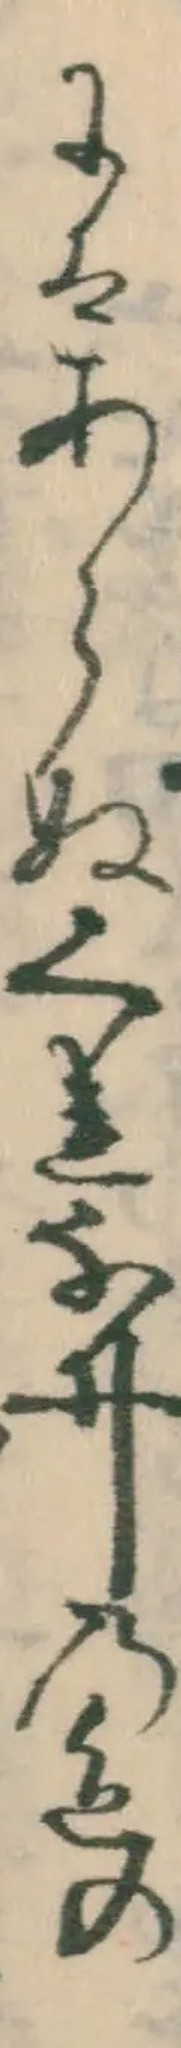にはあらぬくれなゐの色の
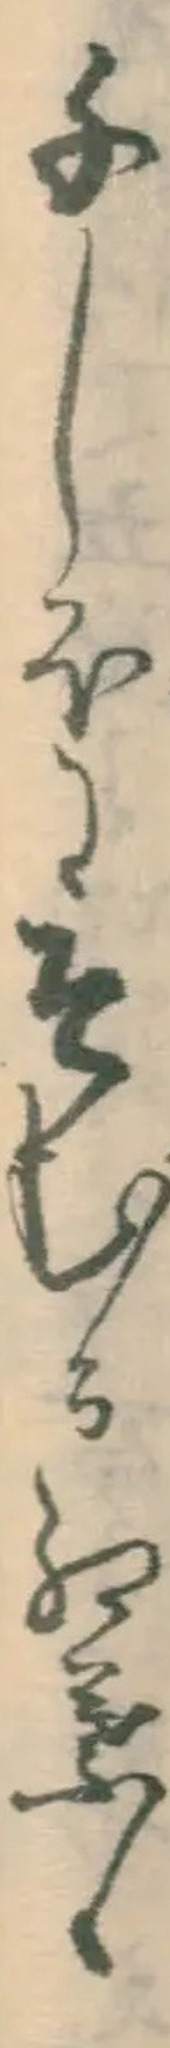千しほにそむる紅葉々
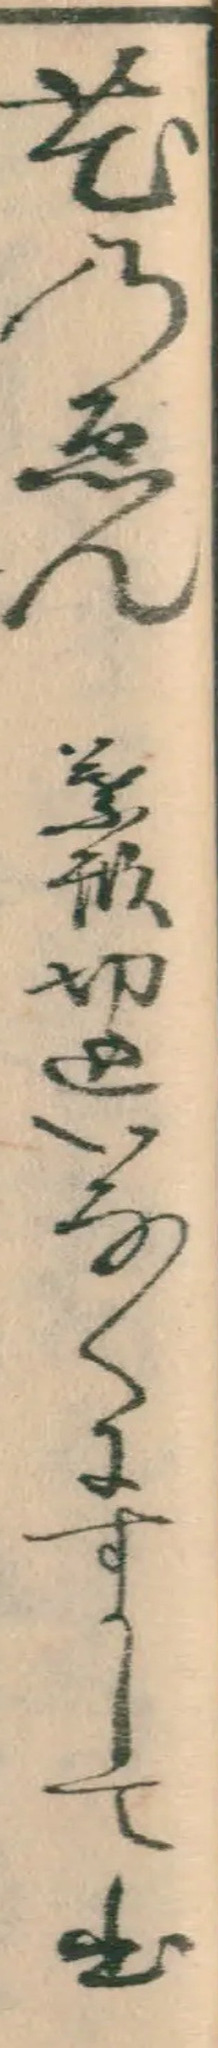花のゑん葉形切込いろ〳〵にすかして出
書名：紅葉集
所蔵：国立国会図書館 National Diet Library, JAPAN
